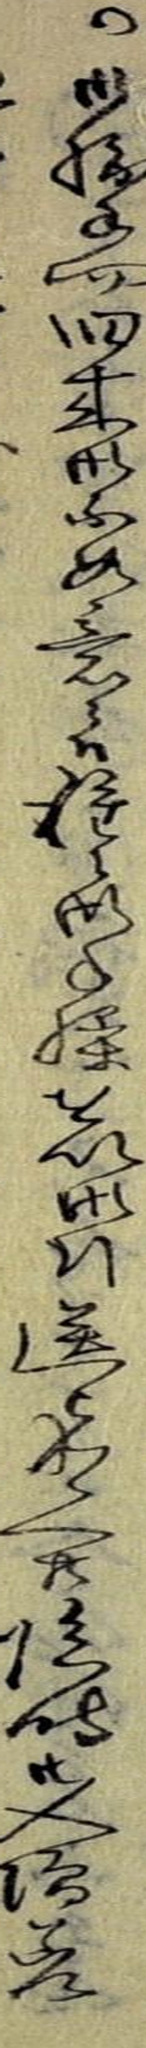○御勝手向旧来御不如意ニ付種々御手繰を以御引送被成候へ共臨時御入増差
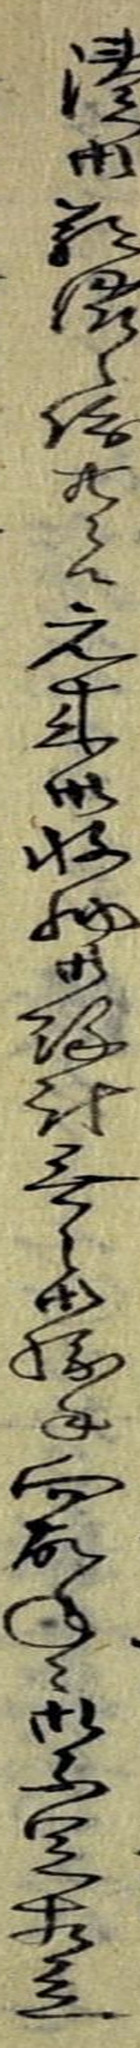湊御難渋之儀共ニ候元来御収納御余計無之御勝手向故年々御不足相立
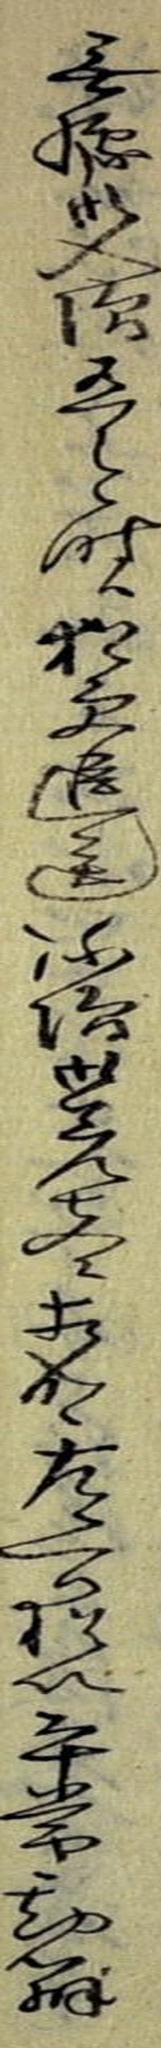無拠御入増有之候時ハ猶受追送弥増御差支ニ相成候左候へハ猶以平常勘弁
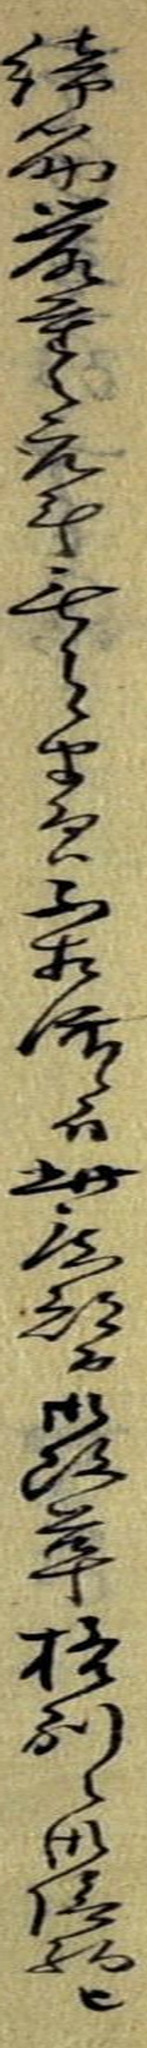締筋厳重之取計無之半而ハ不相済候ニ付此度都而御改革格別之御倹約被
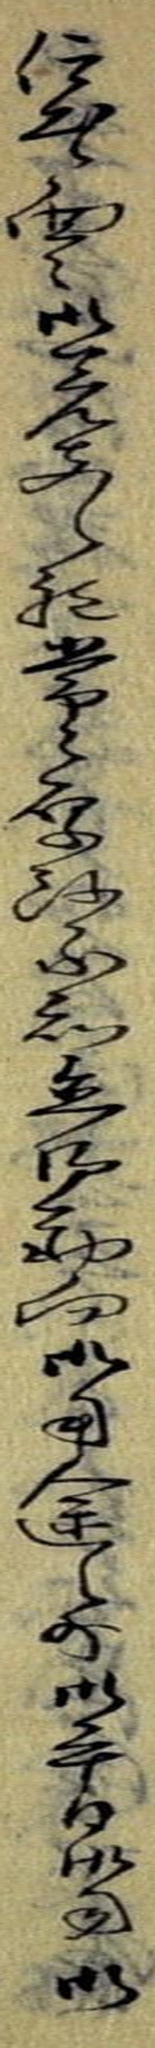仰出候面々御差支候程常々厚致承知置御勤向御用途之外御平日御用御
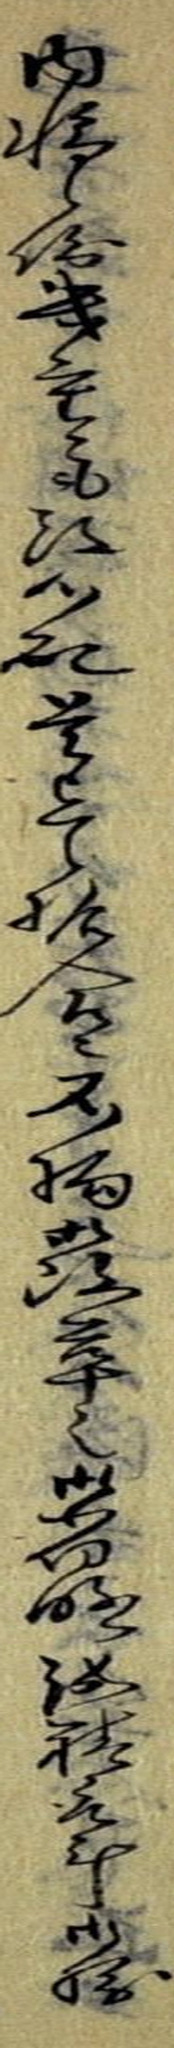内輪之儀幾重ニも致心配是迄之振合ニ不拘御改革之御省略誠精取計御勝
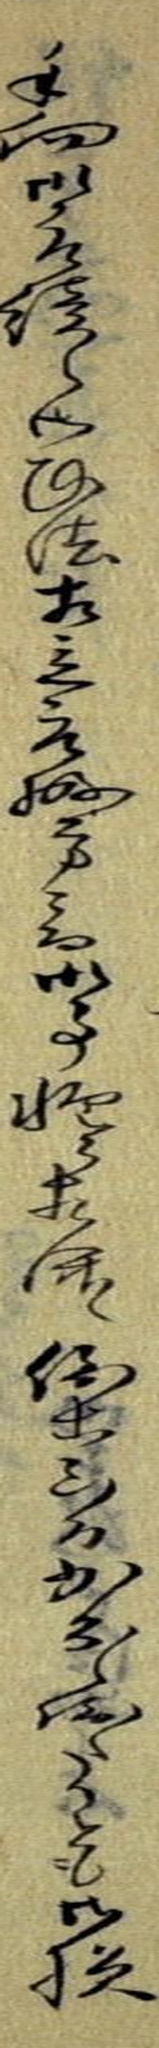手向御取続候御趣法相立取扱方ニ而御事軽ニ相済候儀等至而加分之儀たりとも御損
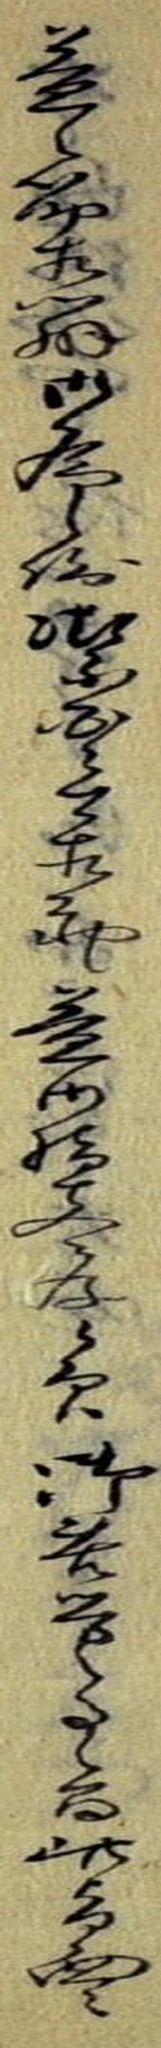益之筋相弁御為之儀潔白ニ可相勤候益御指支ニ及候而ハ御苦労之事候間此旨面々
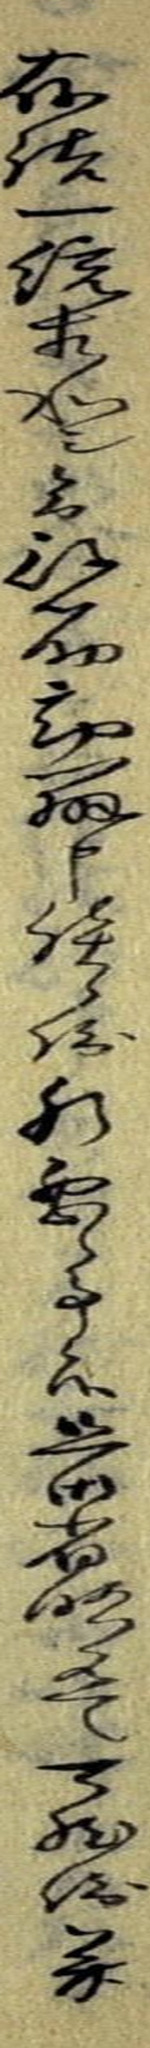存詰一統相和シ候而役筋勘弁申談候儀肝要之事ニ候且御省略有之可然儀并
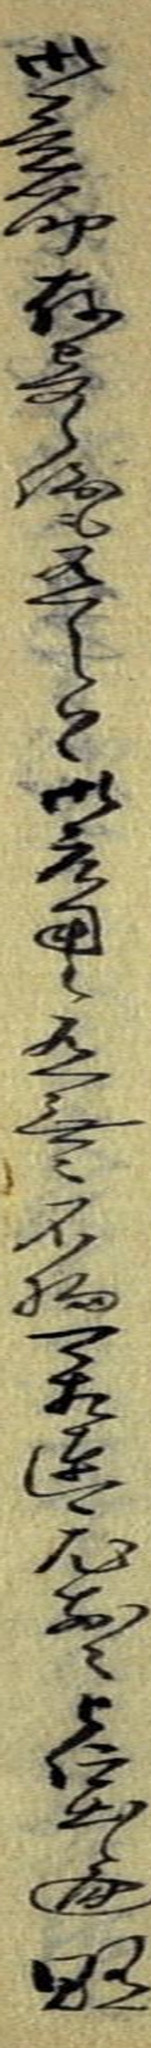御益筋存寄候儀も有之候ハヽ御取用之有無ニ不拘可相達候尤前々被仰出候通賄
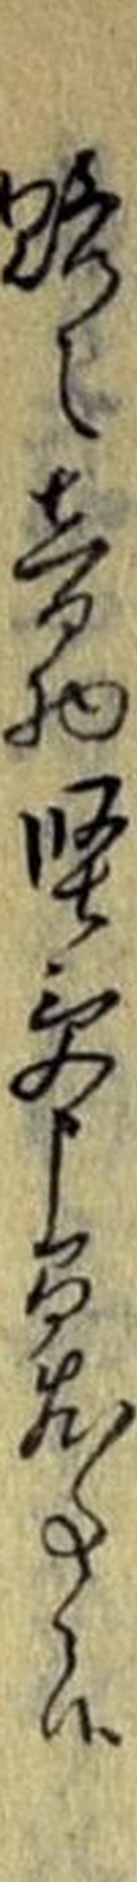賂之音物堅受申間敷事ニ候
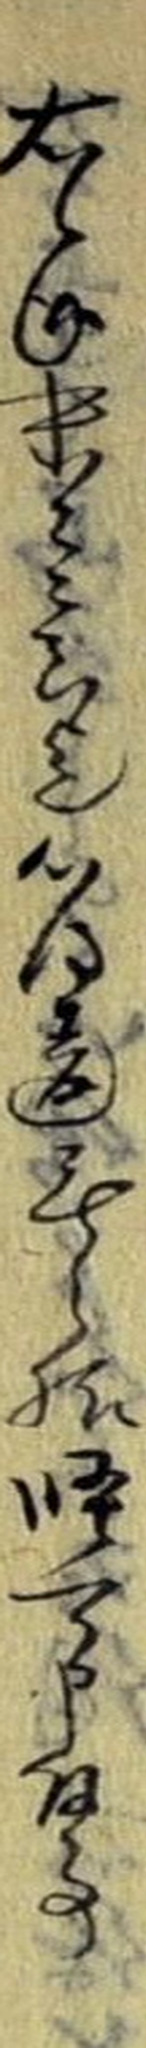右之趣末々ニ至迄心得違無之様堅可申付事
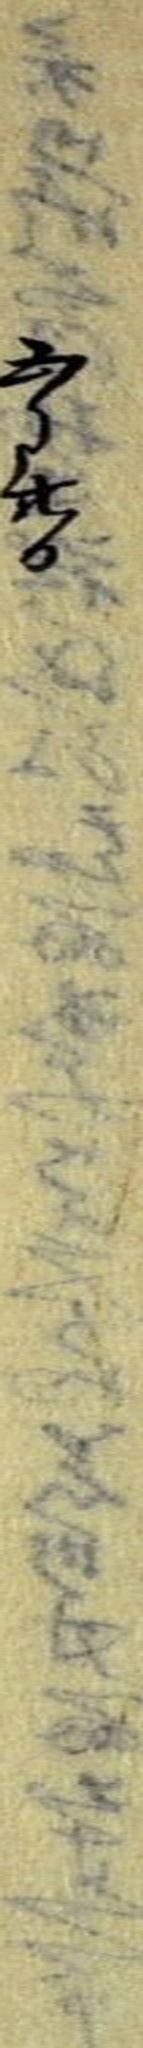五月廿日
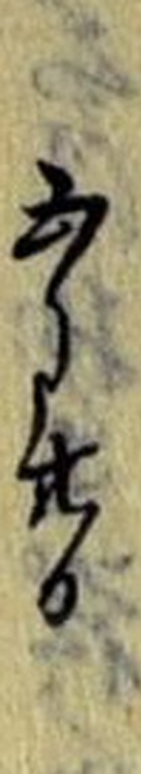五月廿日
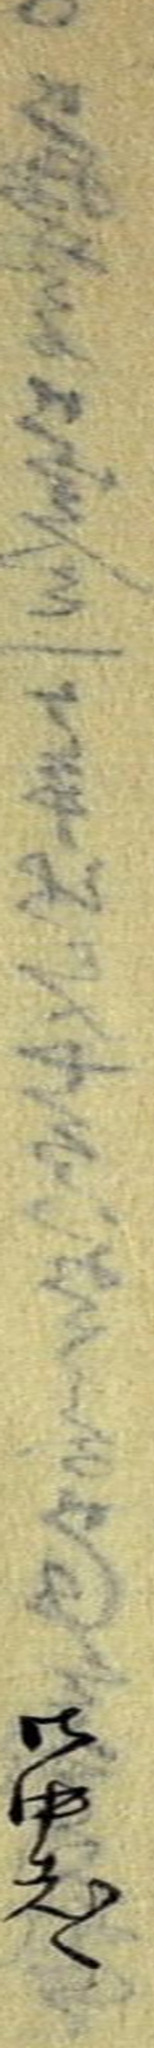御中老へ
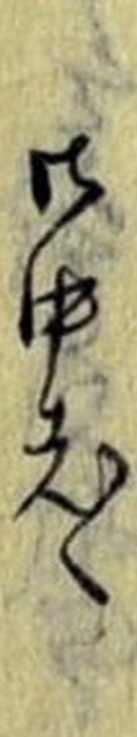御中老へ
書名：命令之部 五
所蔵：福井県文書館 Fukui Prefectural Archives
